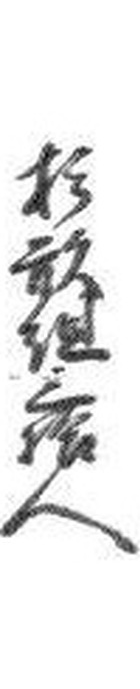杉形組三拾人
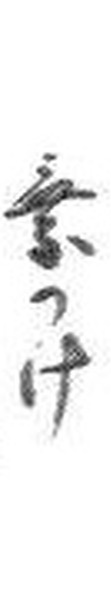乗かけ
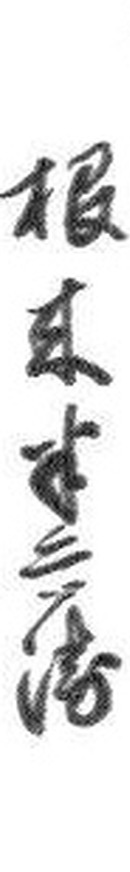根来半兵衛

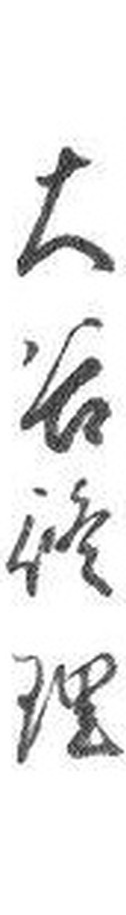大谷修理
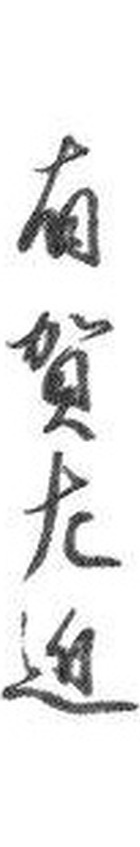有賀左近
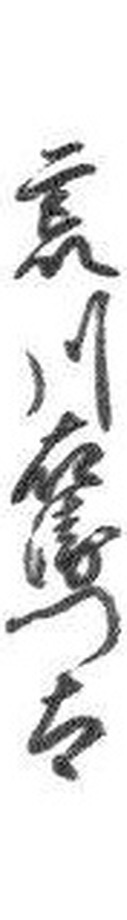荒川右衛門太
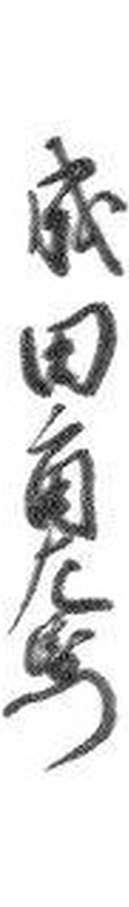成田角左衛門
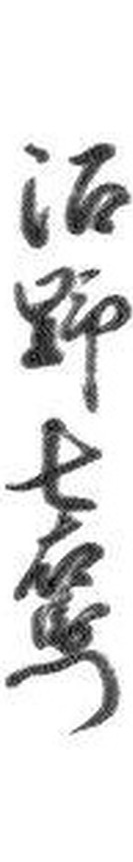沼野七右衛門
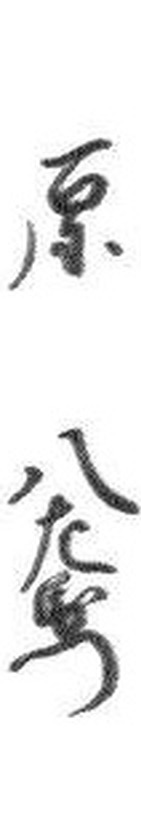原八左衛門
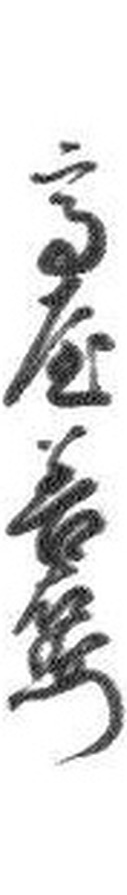高屋善右衛門
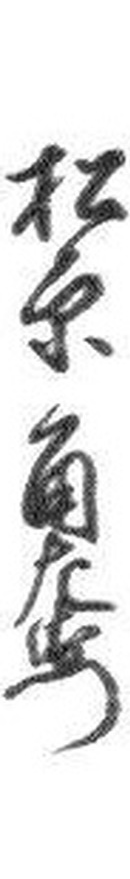松原角左衛門
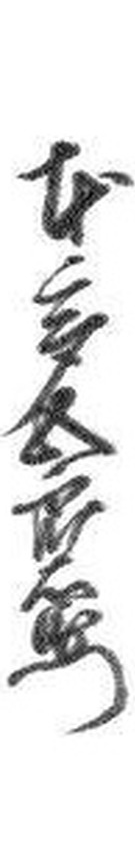本多五郎右衛門
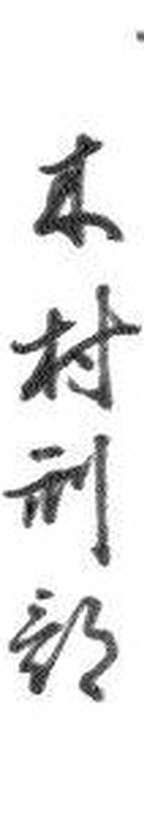木村刑部
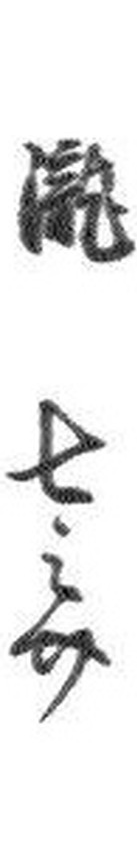瀧七之介
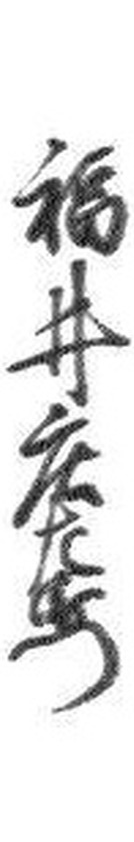福井庄左衛門

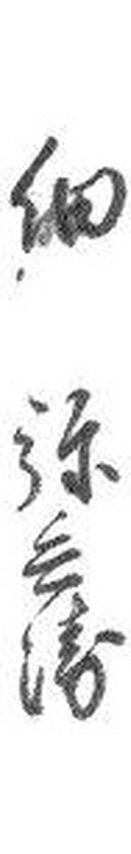佃弥兵衛
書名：家譜 四 忠昌公 従寛永七年到正保四年
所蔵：福井県文書館 Fukui Prefectural Archives
